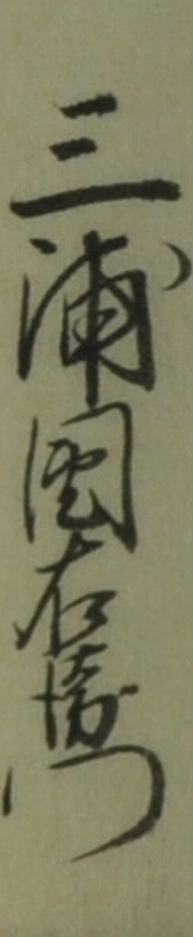三浦團右衛門

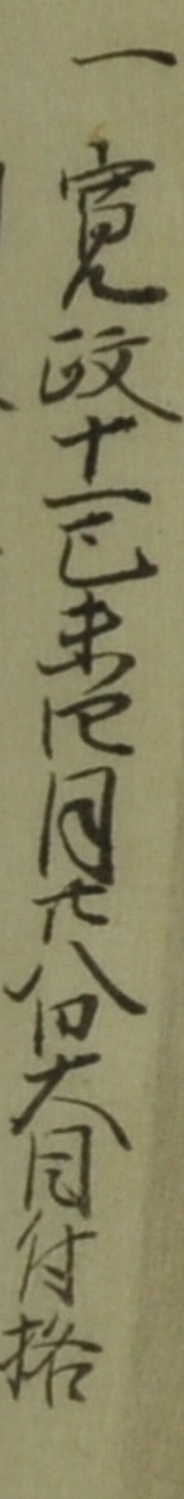一寛政十一己未四月廿八日大目付格
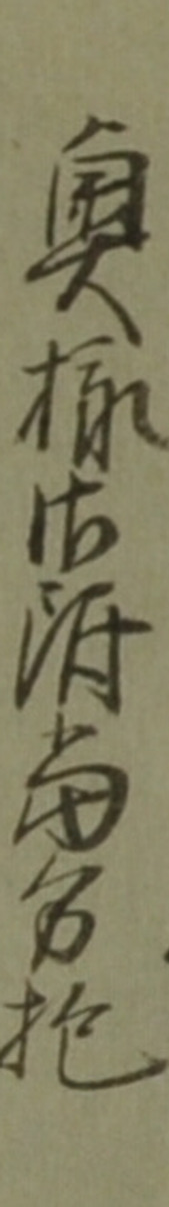奥様御附当方抱
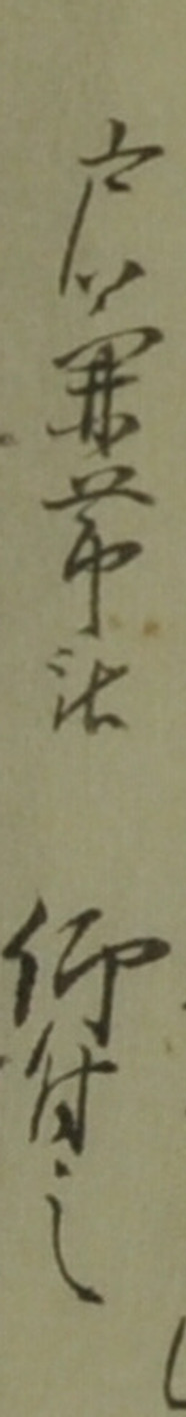戸兼帯被仰付之
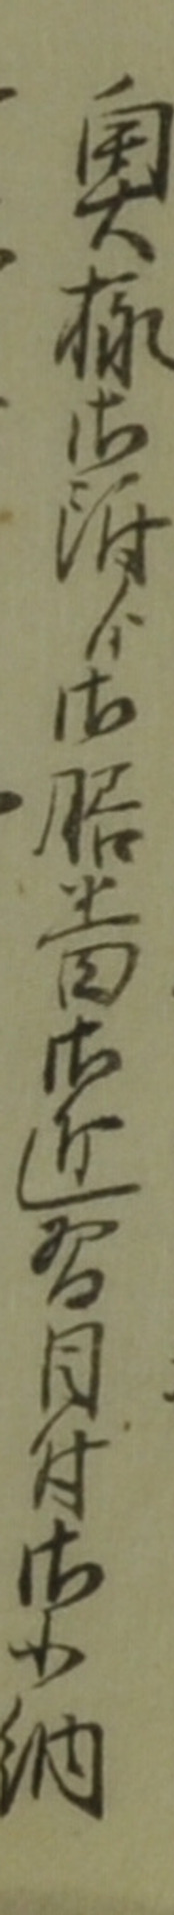奥様御附ゟ御膳番御近習目付御小納
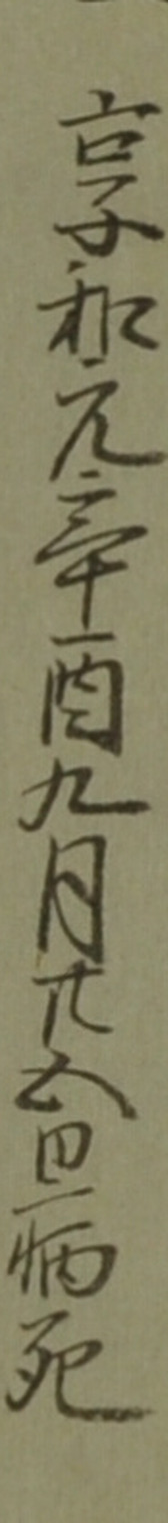一享和元辛酉九月廿五日病死
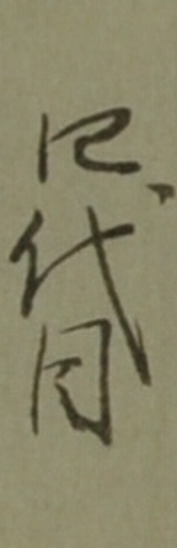四代目
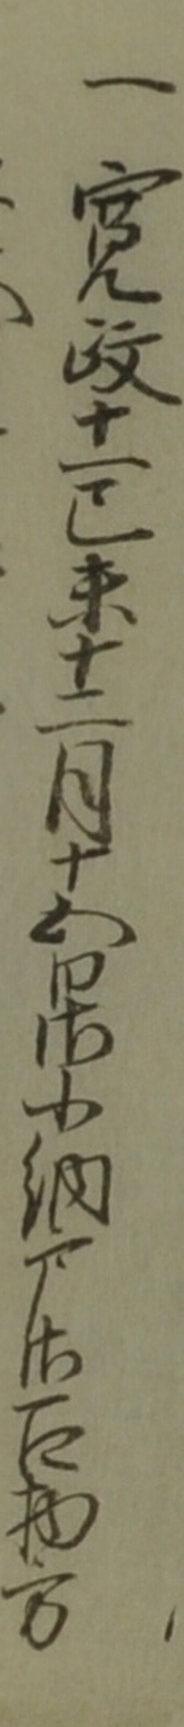一寛政十一己未十二月十五日御小納戸御召物方
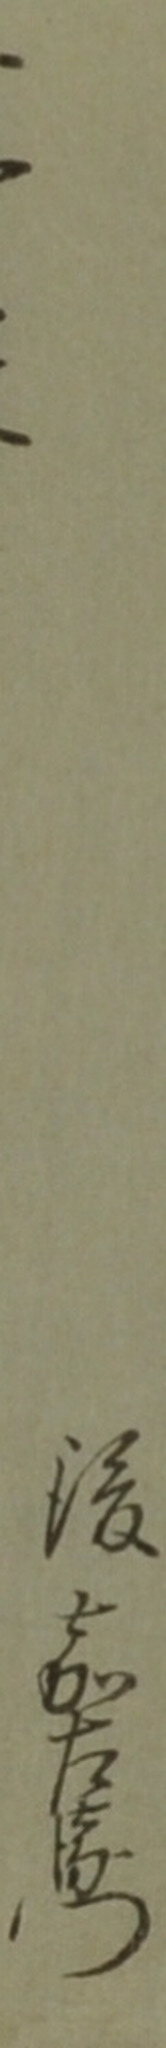後嘉左衛門
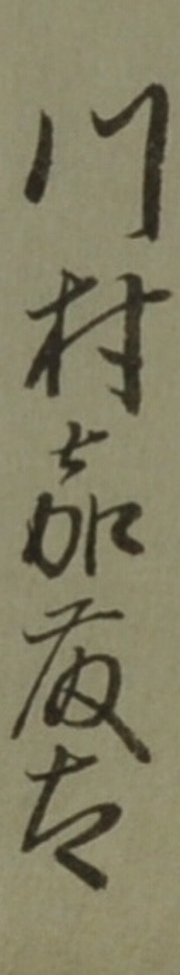川村嘉藤太
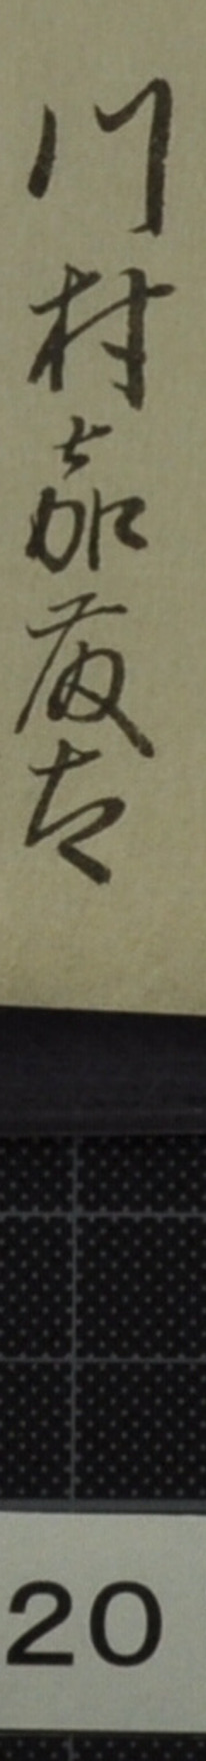川村嘉藤太
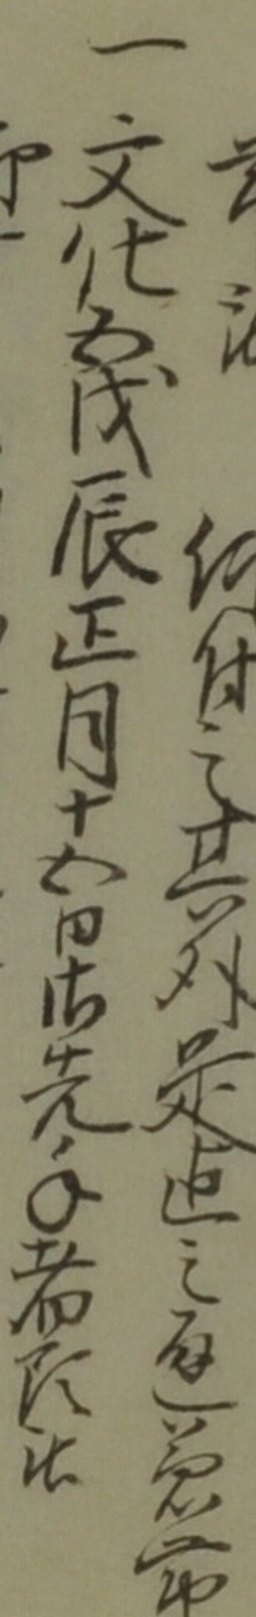一文化五戊辰正月十五日御先手者頭被
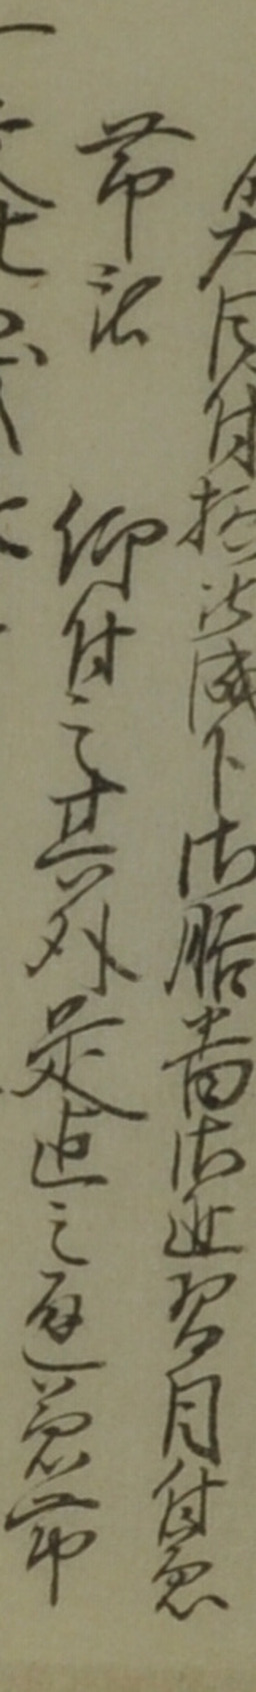帯被仰付之其外是迄之通兼帯
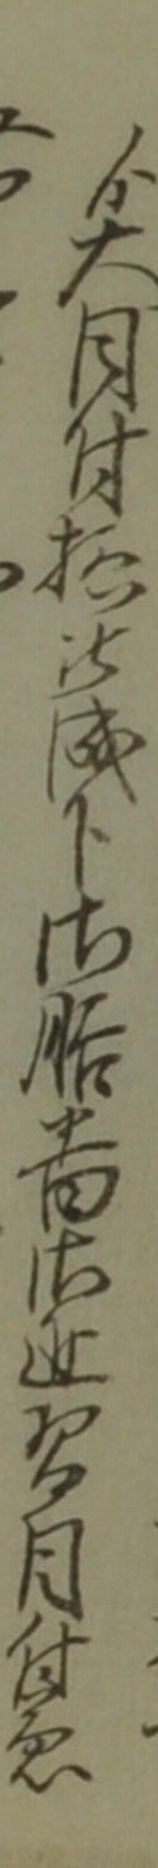ゟ大目付格被成下御膳番御近習目付兼
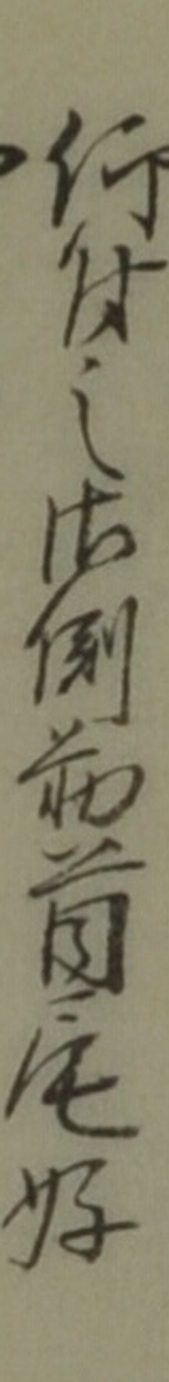仰付之御側勤首尾好
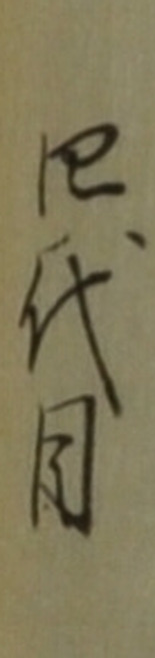四代目
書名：諸御役代々録（四）
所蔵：伊那市立高遠町図書館・合同会社AMANE
